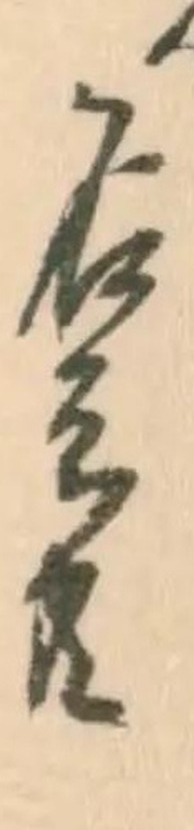名主共
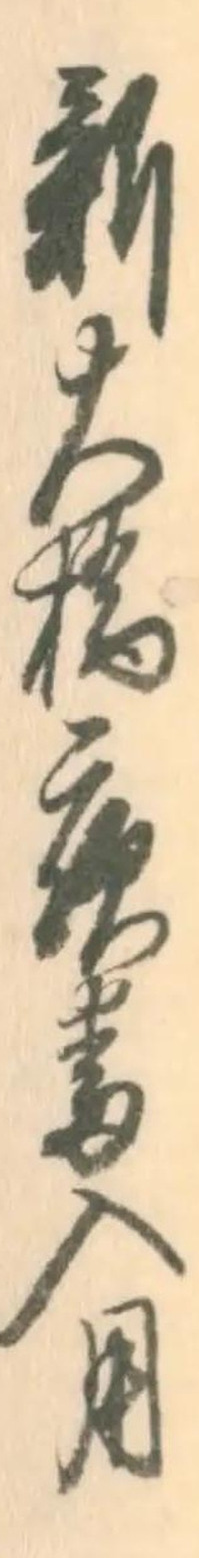新大橋夜番入用
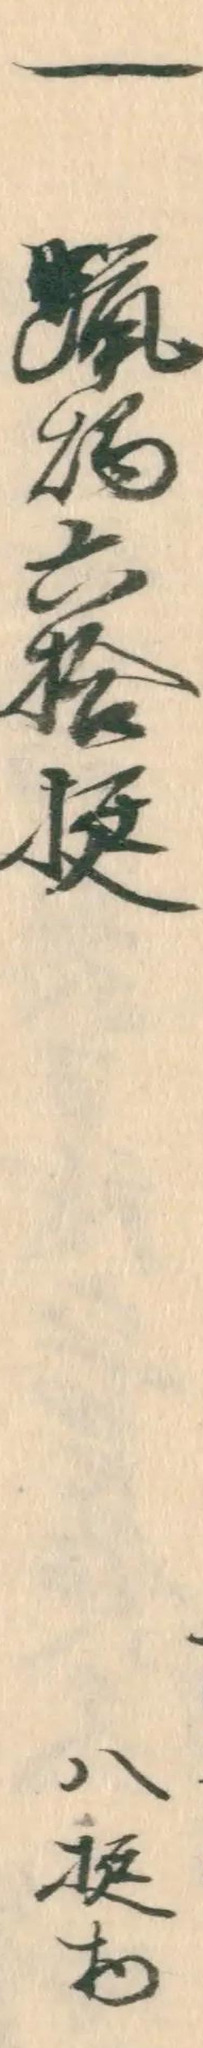一蝋燭六拾挺百文ニ付
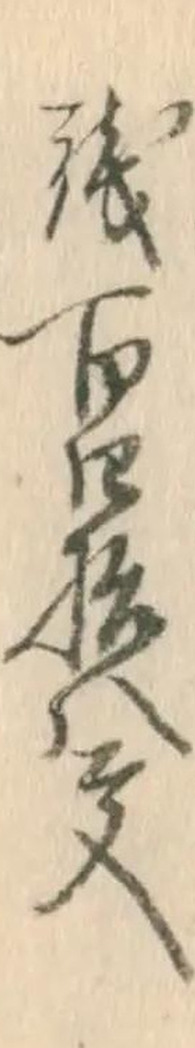銭百四拾八文

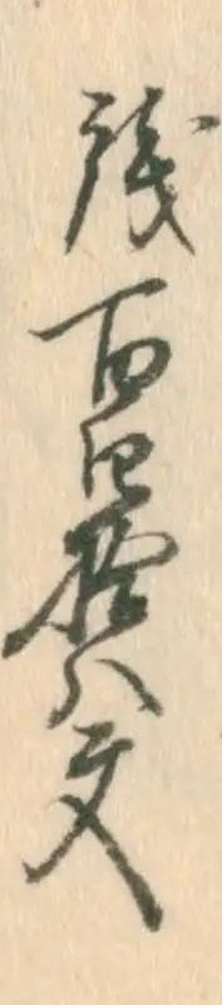銭百四拾八文
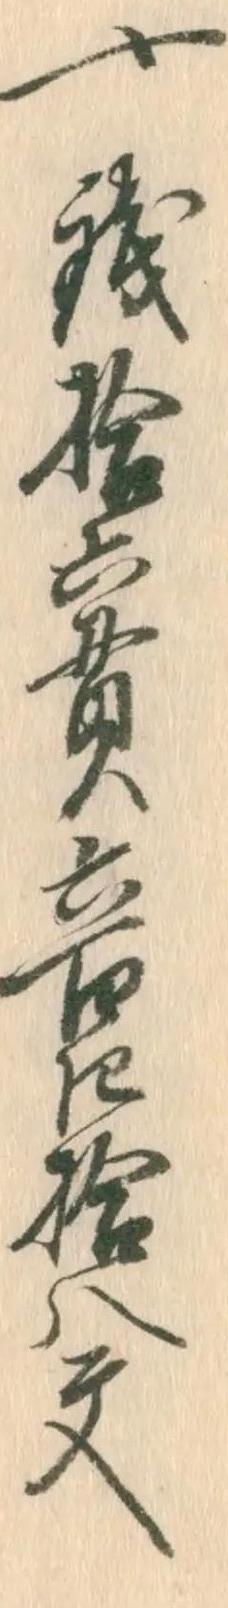〆銭拾六貫六百四拾八文
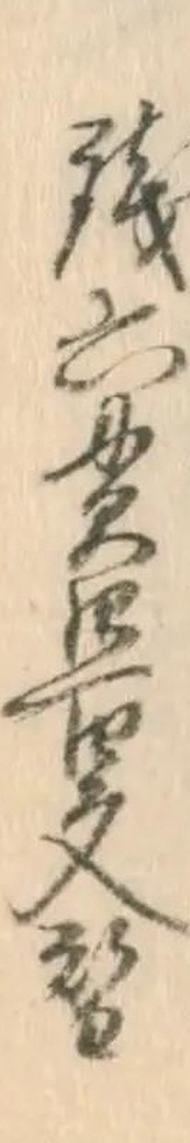銭六貫四百文替
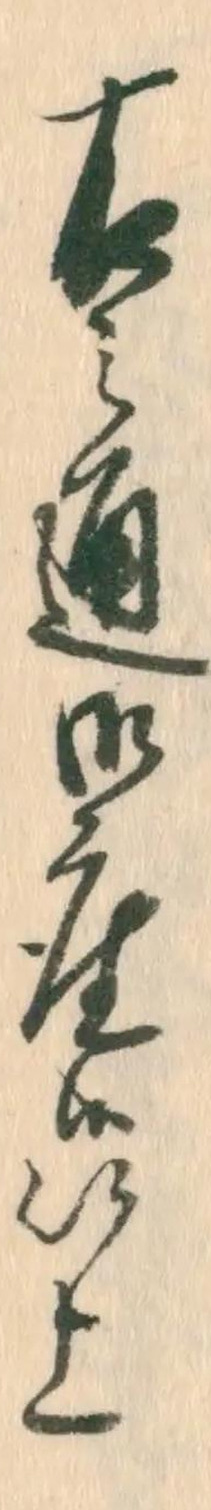右之通御座候以上
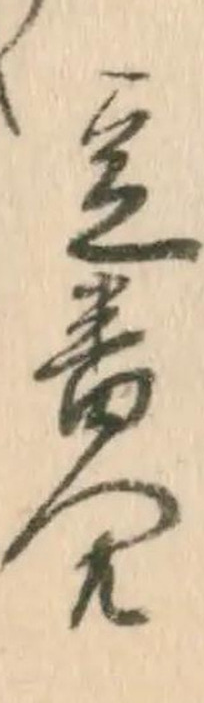定番人共
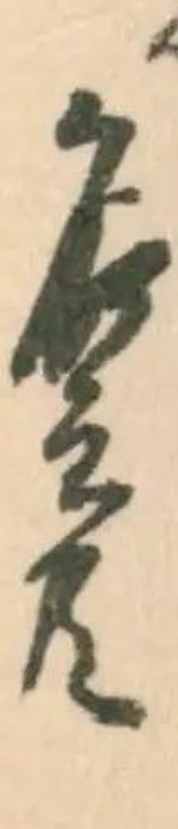名主共
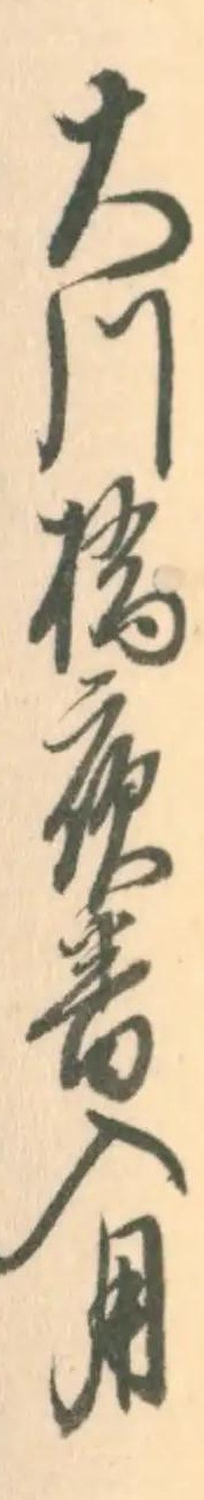大川橋夜番入用
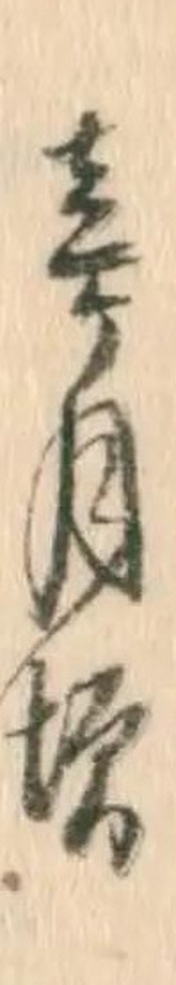壱ケ月増
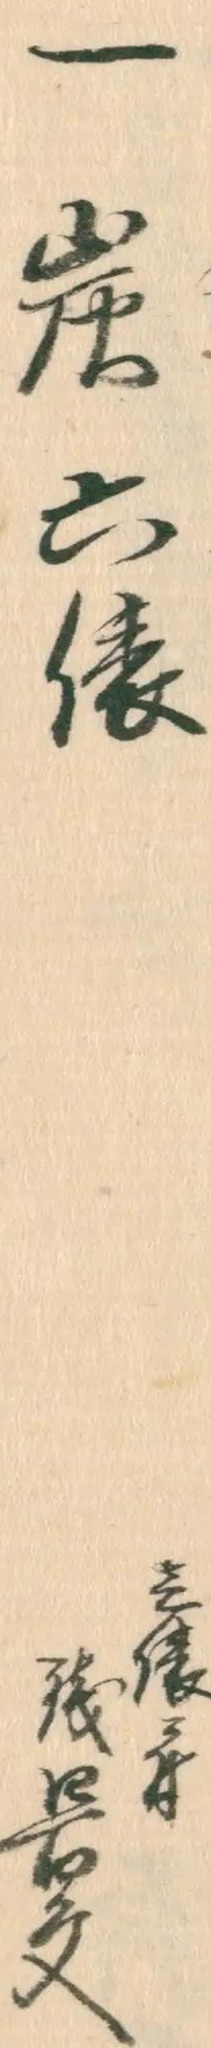一炭六俵壱俵ニ付
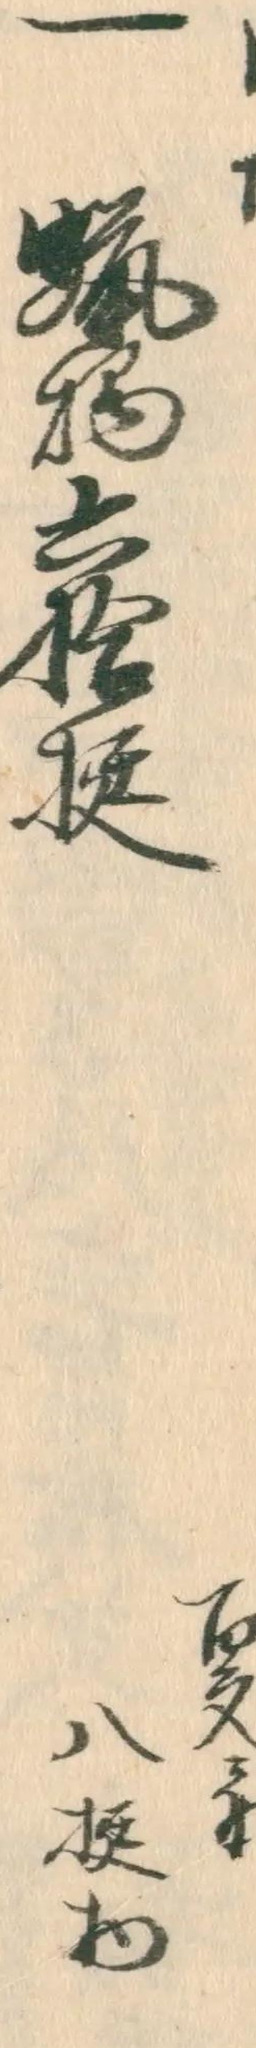一蝋燭六拾挺百文ニ付
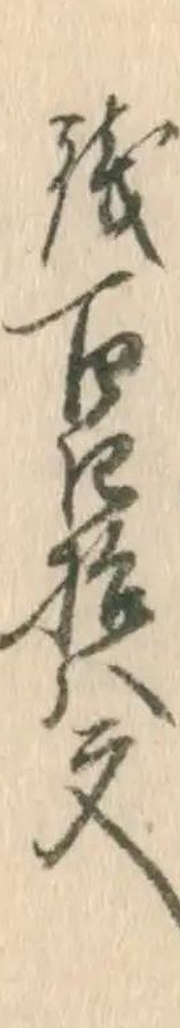銭百四拾八文

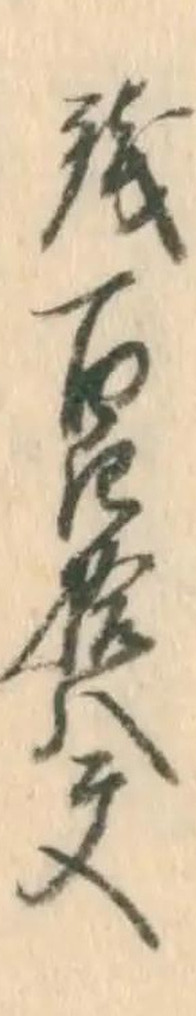銭百四拾八文
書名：三橋 17巻. [7] 三橋小破御修復書留　但御奉行御掛リ替地震潰橋番屋　嘉永四亥年より安政二卯年迄　上
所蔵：国立国会図書館 National Diet Library, JAPAN
